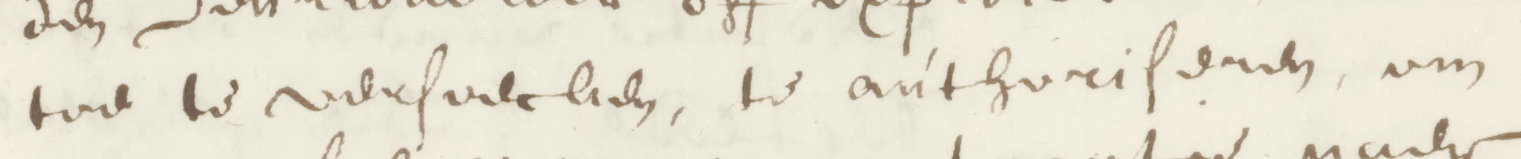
toe te versoecken, te authoriseren, om
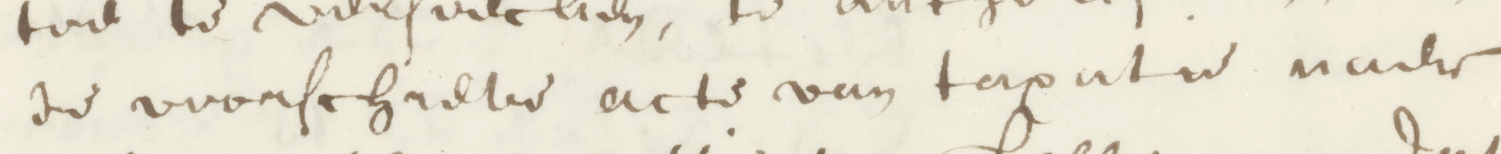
de voorschreve acte van taxatie naer
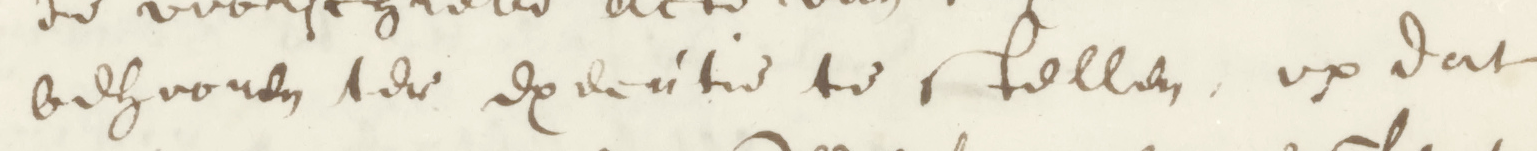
behooren ter executie te stellen, op dat
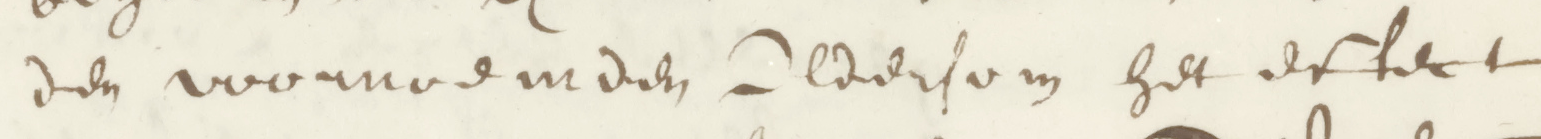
den voornoemden Oldersom het effect
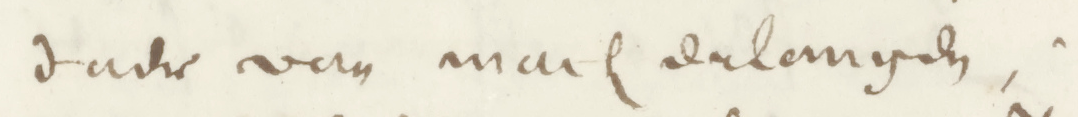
daer van mach erlangen; Waer
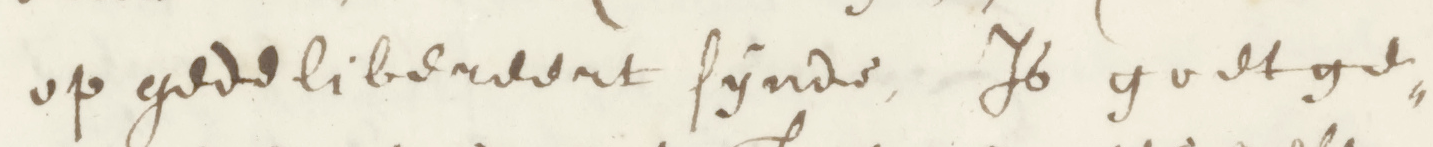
op gedelibereert sijnde, Is goetge„
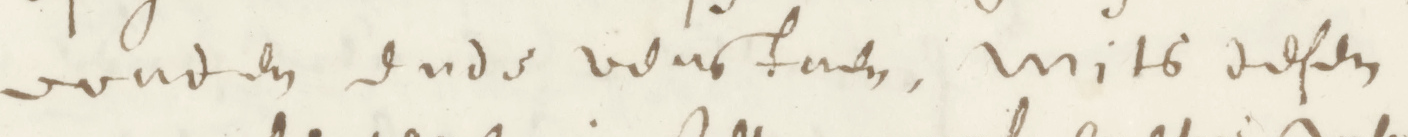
vonden ende verstaen, mits desen
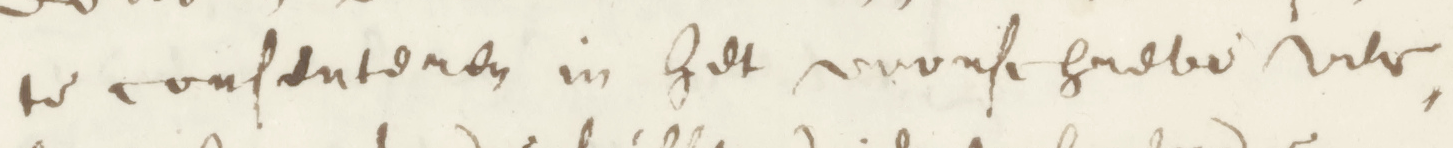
te consenteren in het voorschreve ver„
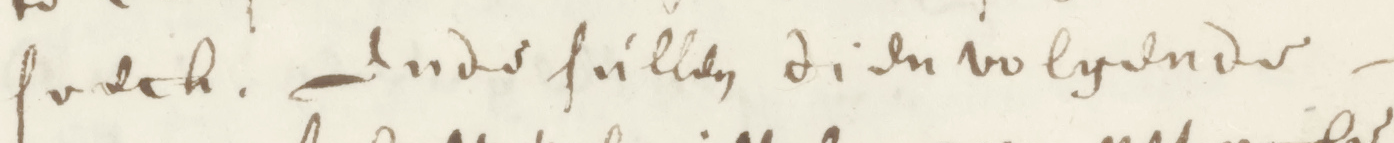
soeck. Ende sullen dienvolgende
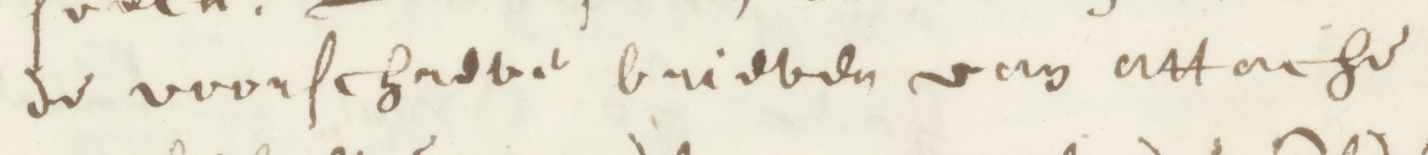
de voorschreve brieven van attache
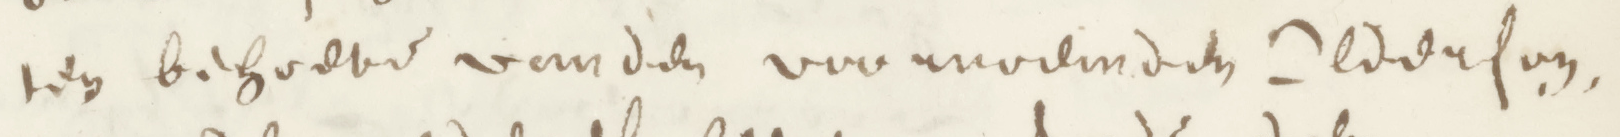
ten behoeve vanden voornoemden Oldersom
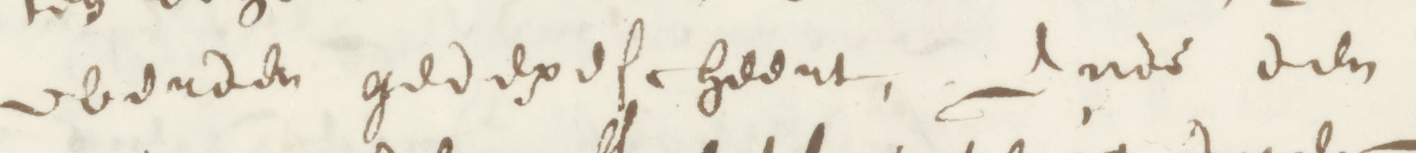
werden gedepescheert, Ende den
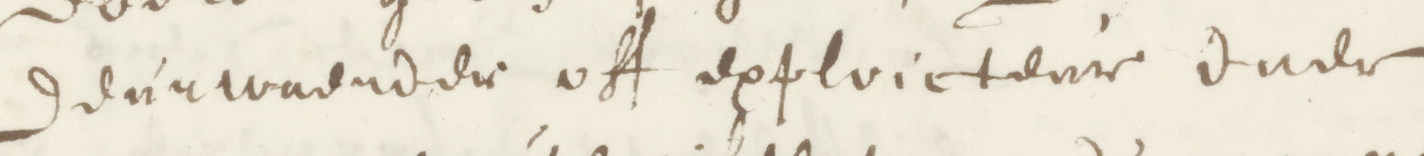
Deurwaerder off exploicteur daer
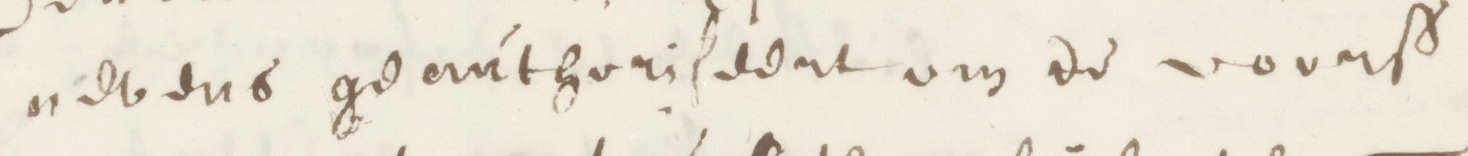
nevens geauthoriseert om de voors.
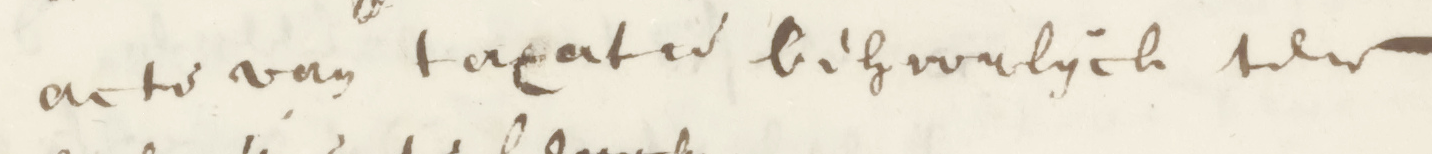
acte van taxatie behoorlijck ter
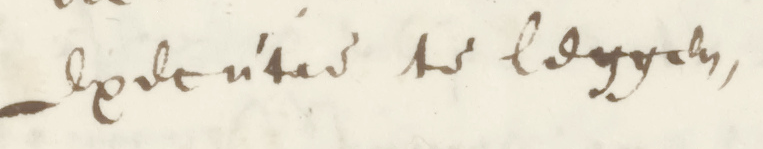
executie te leggen.
